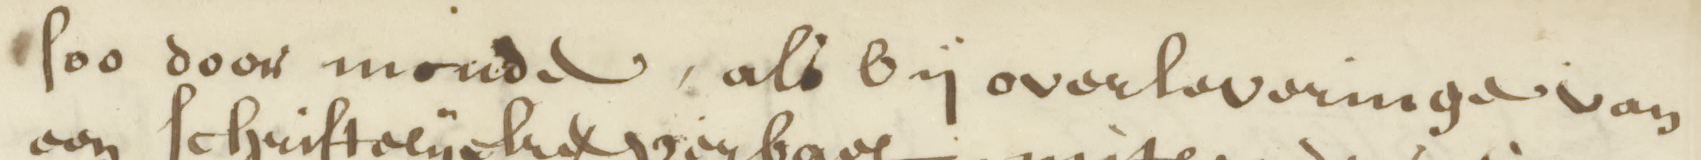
soo door monde, als bij overleveringe van
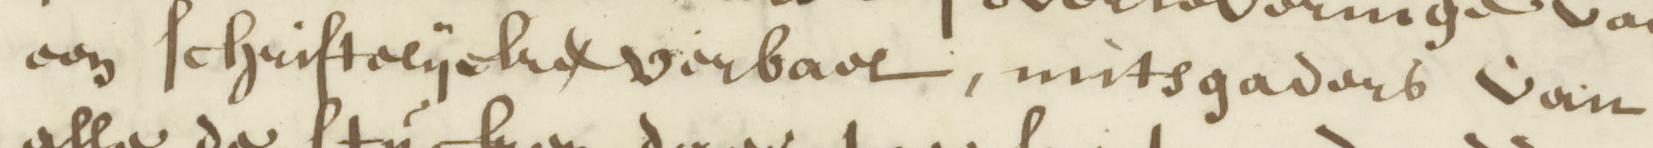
een schriftelijcke verbael, mitsgaders van
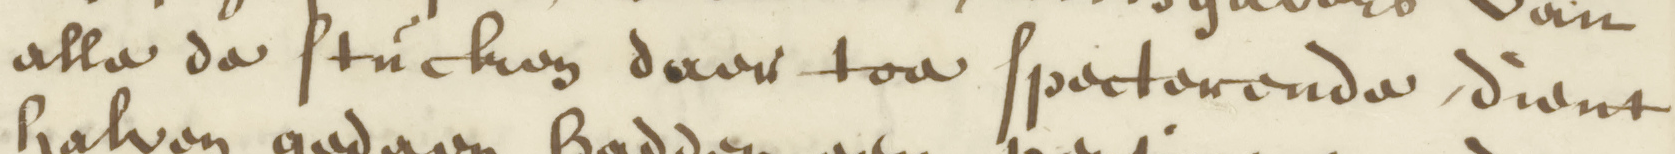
alle de stucken daer toe specterende, dient
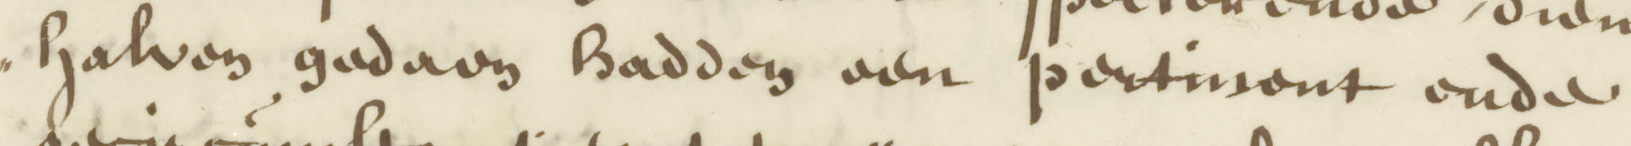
halven gedaen hadden een pertinent ende
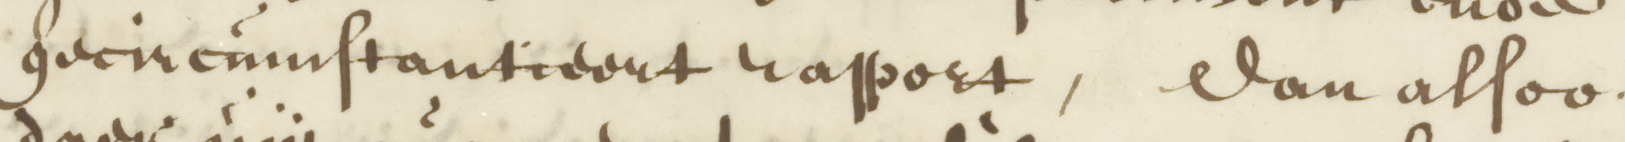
gecircumstantieert rapport. Dan alsoo
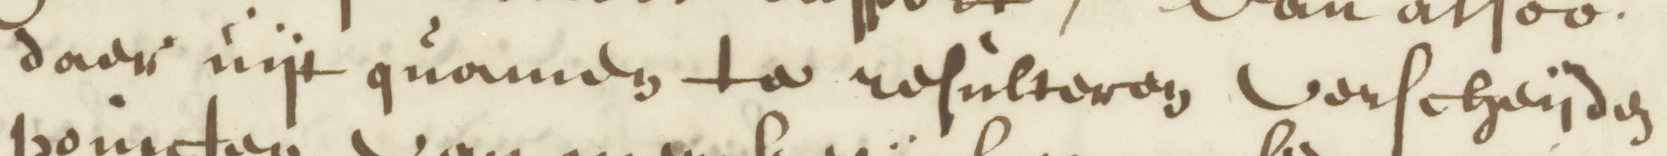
daer uijt quamen te resulteren verscheijden
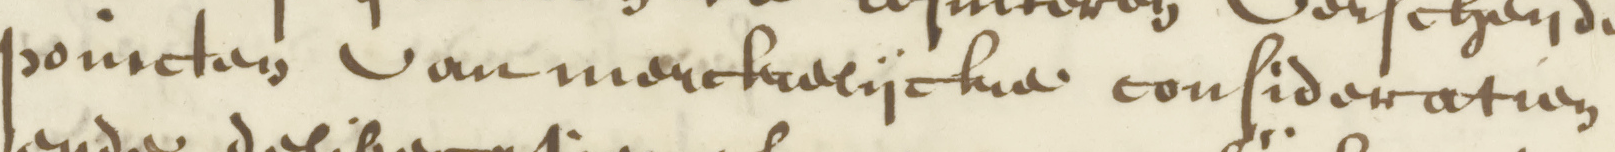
poincten van merckelijcke consideratien
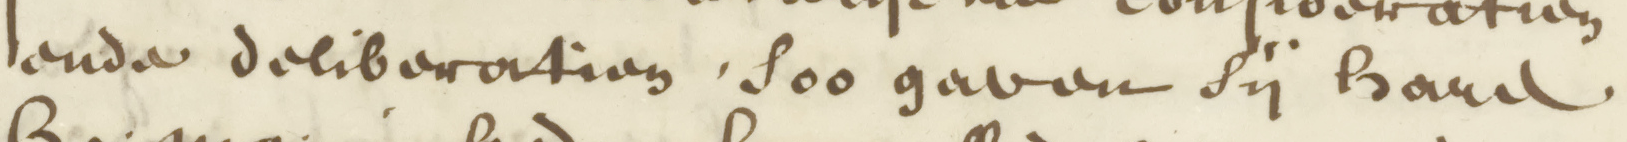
ende deliberatien, soo gaven sij hare
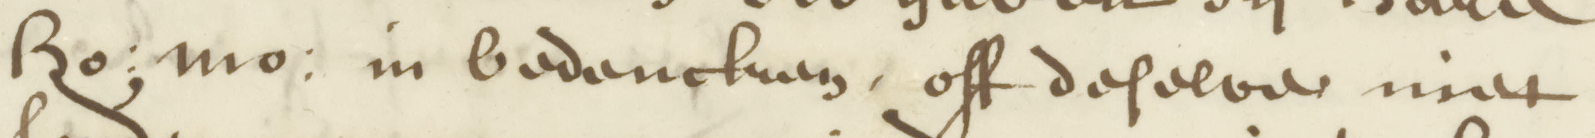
Ho:Mo: in bedencken, off deselve niet
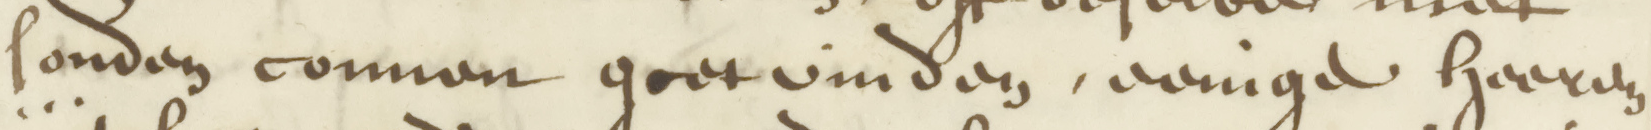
souden connen goetvinden, eenige heeren
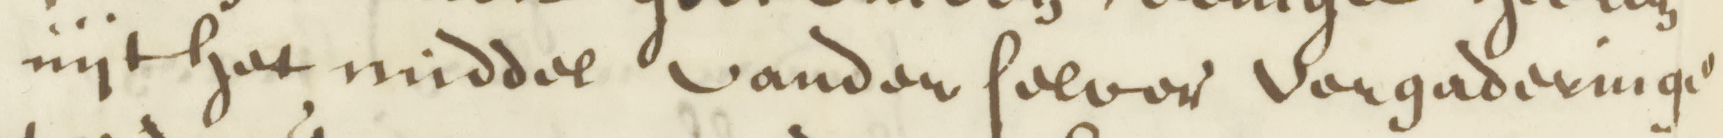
uijt het middel vander selver vergaderinge
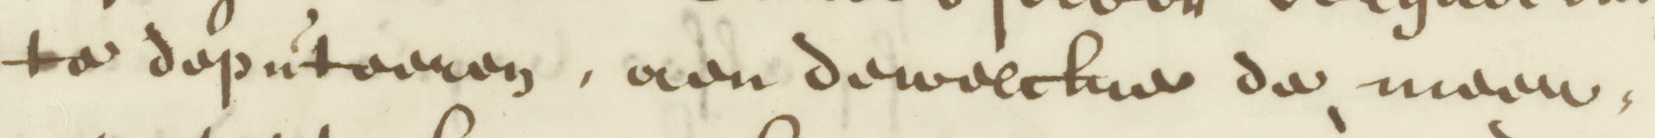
te deputeeren, aen dewelcke de meer,,
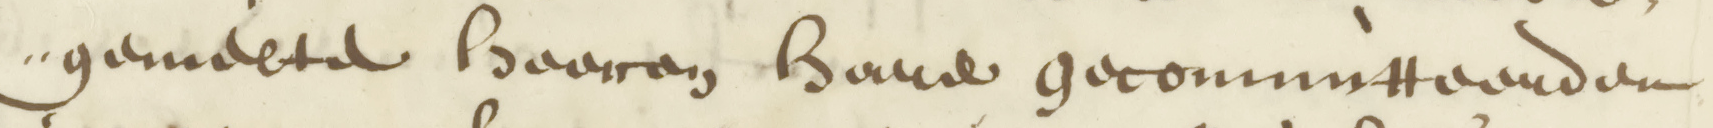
,,gemelte heeren hare gecommitteerden
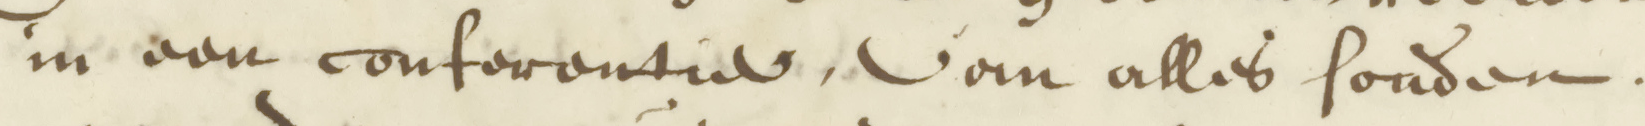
in een conferentie, van alles souden
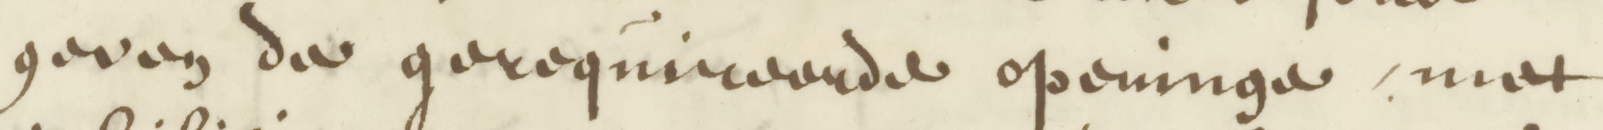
geven de gerequireerde openinge, met
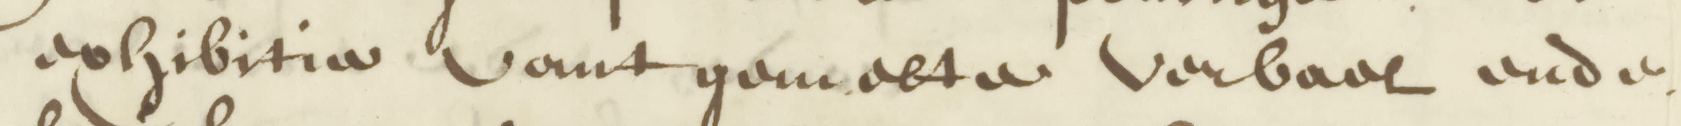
exhibitie vant gemelte verbael ende
